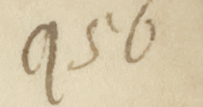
456
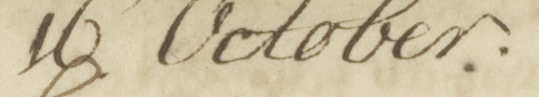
16 October.
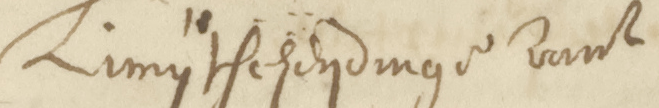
Limijtscheydinge van
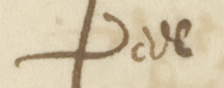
Peel
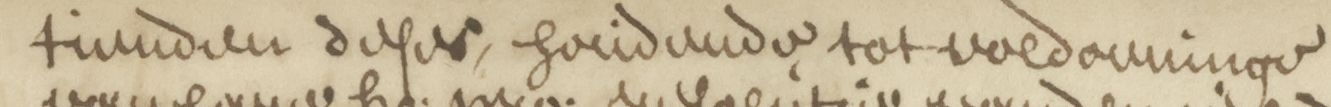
tienden deses, houdende tot voldoeninge
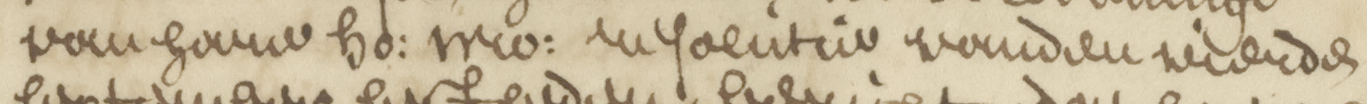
van hare Ho:Mo: resolutie vanden vierden
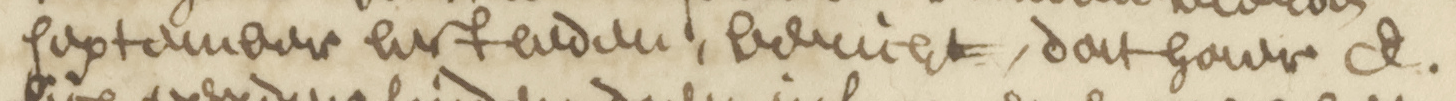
september lestleden, bericht, dat haer E.
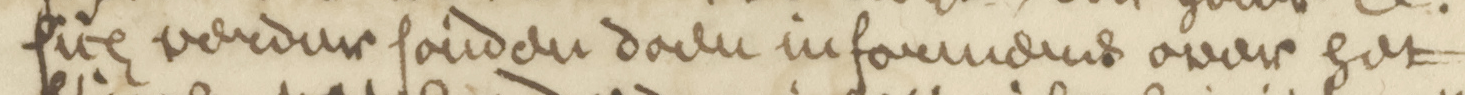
sich verder souden doen informeren over het
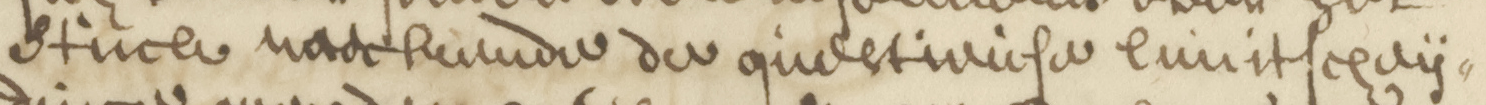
stuck raeckende de questieuse limitscheij„
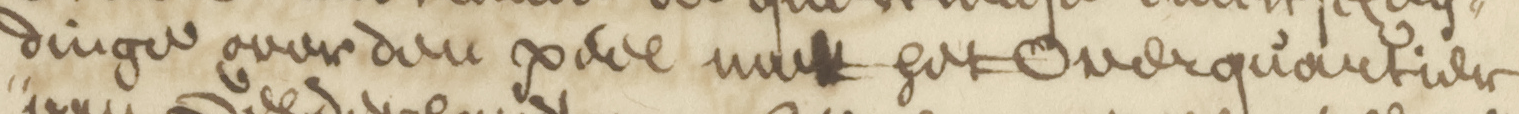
„dinge over den peel met het Overquartier
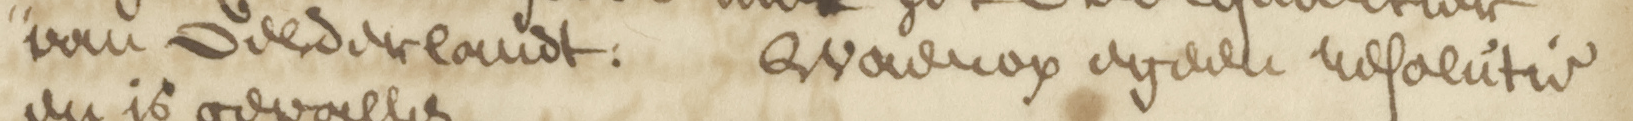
van Gelderlandt: Waerop egeen resolutie
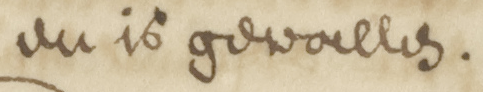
en is gevallen.
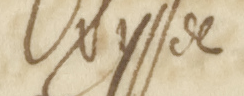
Ovyssel
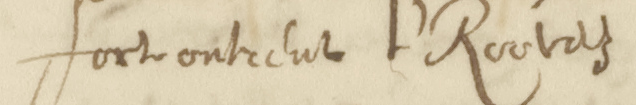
fort ontrent t'Rooveen
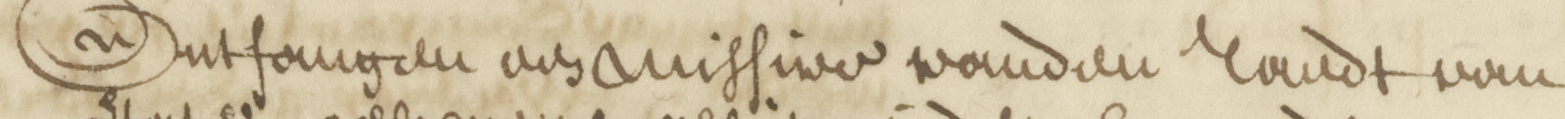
Ontfangen een Missive vanden Raedt van
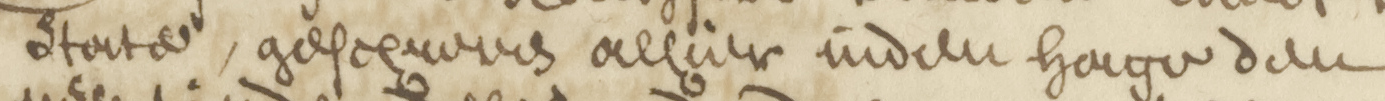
State, geschreven alhier inden hage den
